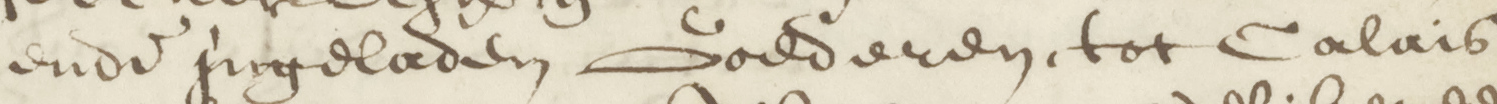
ende ingeladen Goederen, tot Calais
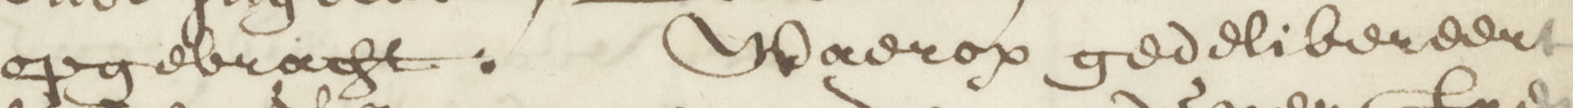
opgebracht: Waerop gedelibereert
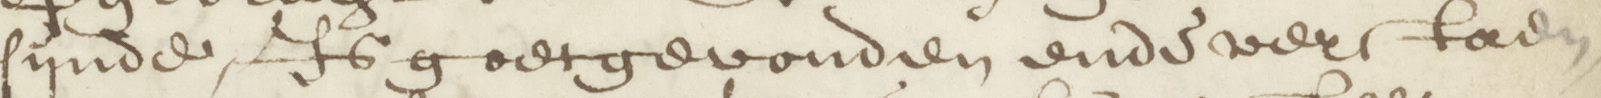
sijnde, Is goetgevonden ende verstaen,
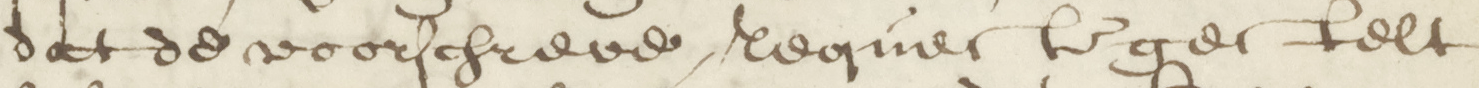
dat de voorschreve requeste gestelt
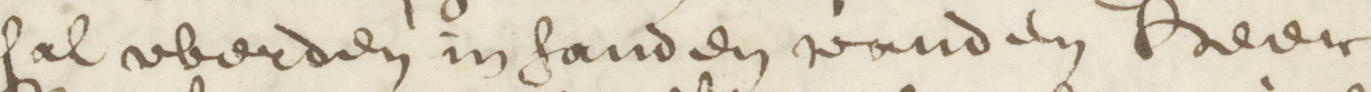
sal werden in handen vanden Heer
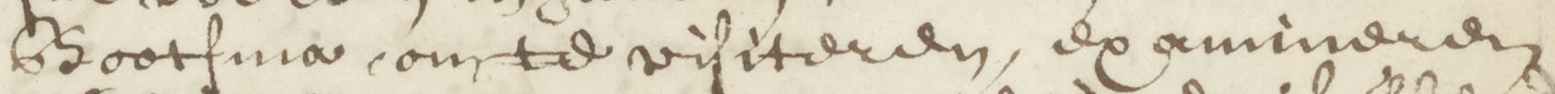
Bootsma, om te visiteren, examineren
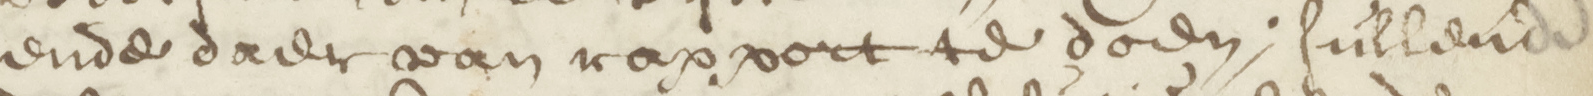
ende daer van rapport te doen; sullende
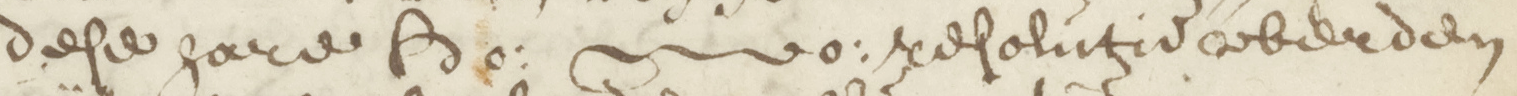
dese hare Ho:Mo: resolutie werden
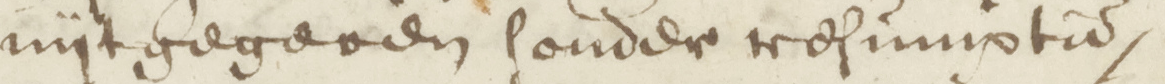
uijtgegeven sonder resumptie.
